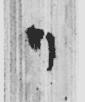人
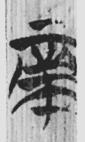帝
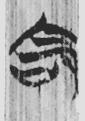命
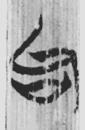句
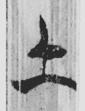土
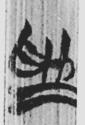爲
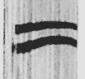二
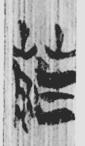{艹阝仌}（陵）
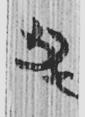屯
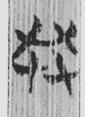共
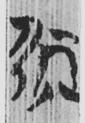凥
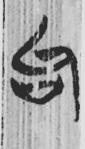句
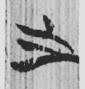之
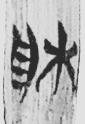牀
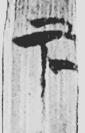下
